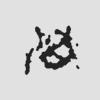冬
